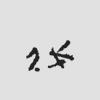伐
